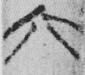六
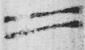二
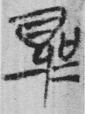鳴
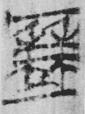○（謙）
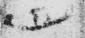四
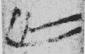亡
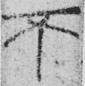不
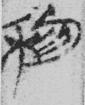利
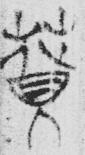○（撝）
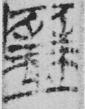○（謙）
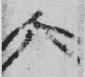六
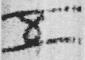五
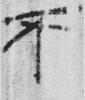不
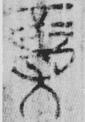○（富）
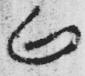㠯（以）
